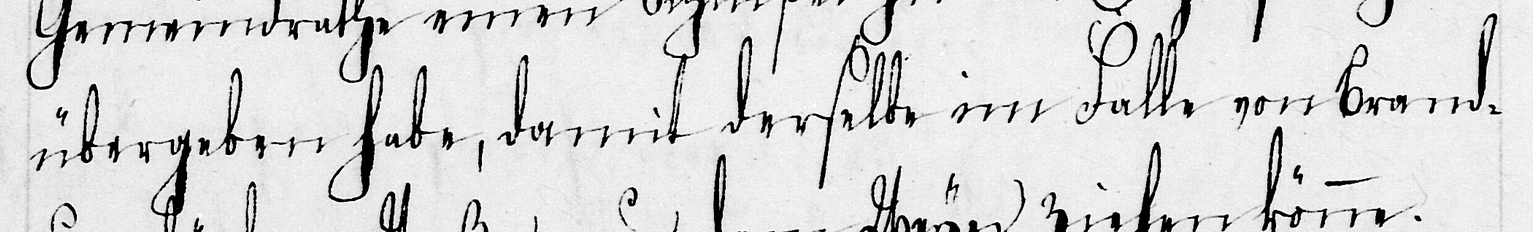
übergeben habe, damit derselbe im Falle von Brand¬
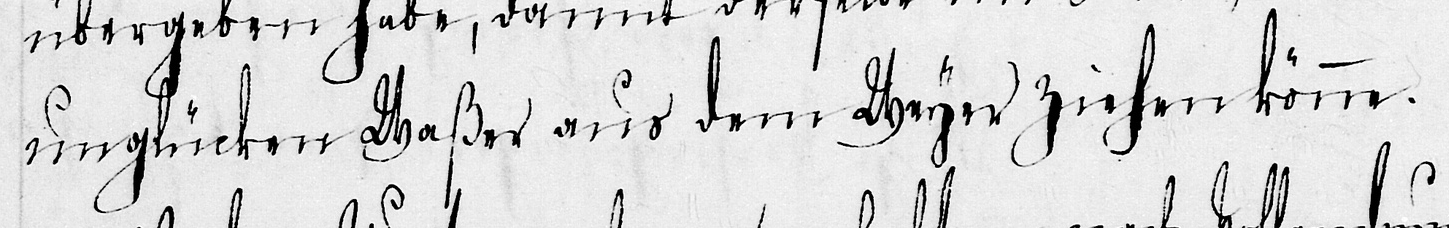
unglücken Waßer aus dem Weyer ziehen könne.
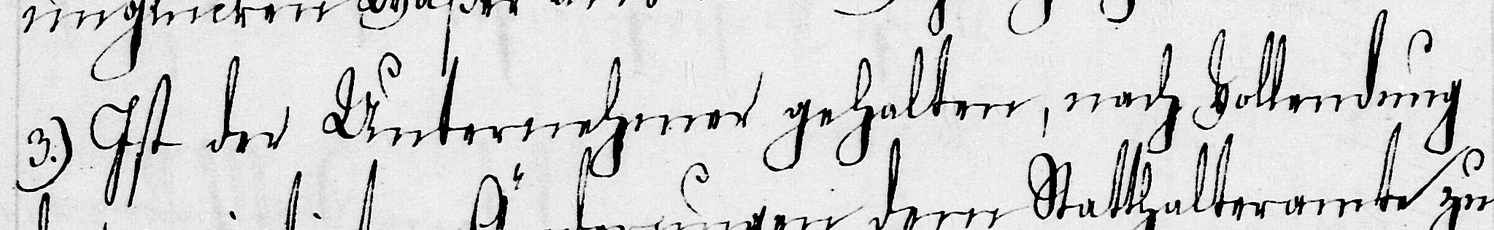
3.) Ist der Unternehmer gehalten, nach Vollendung
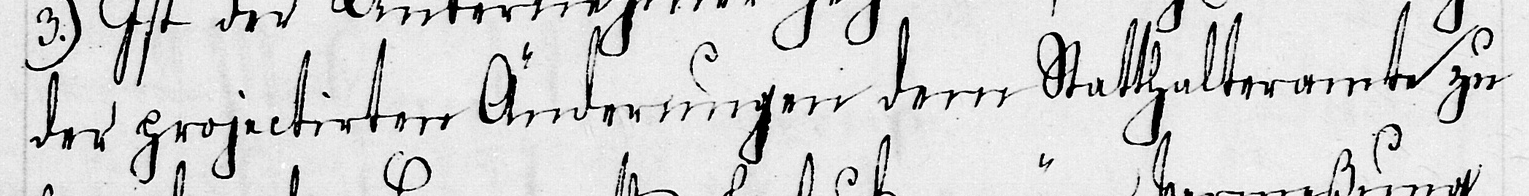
der projectirten Änderungen dem Statthalteramte zu
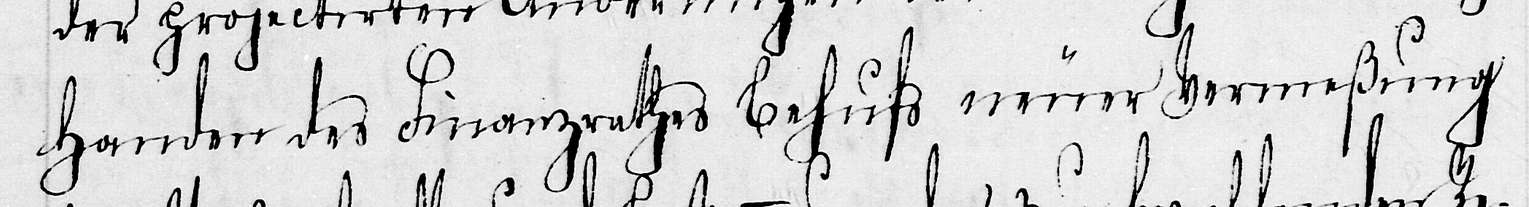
Handen des Finanzrathes Behufs neuer Vermeßung
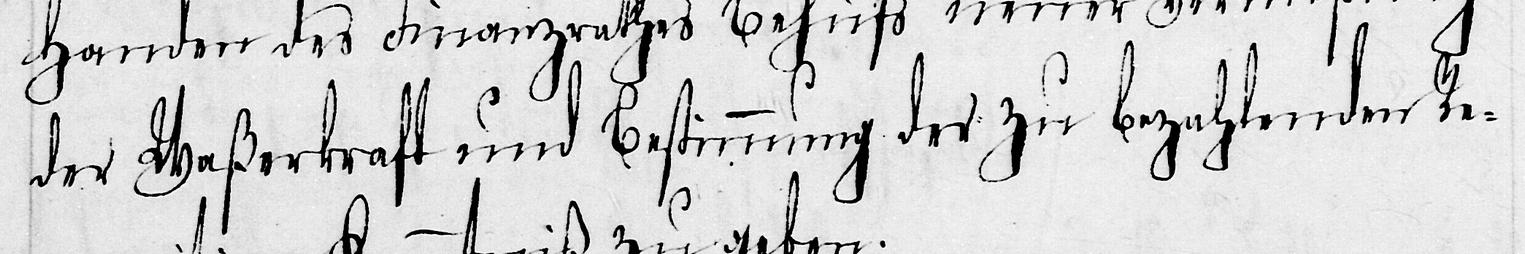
der Waßerkraft und Bestimmung der zu bezahlenden Re¬
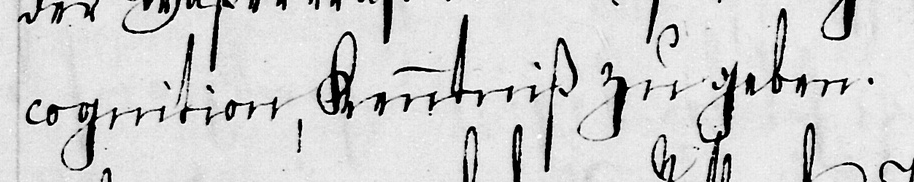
cognition, Kenntniß zu geben.
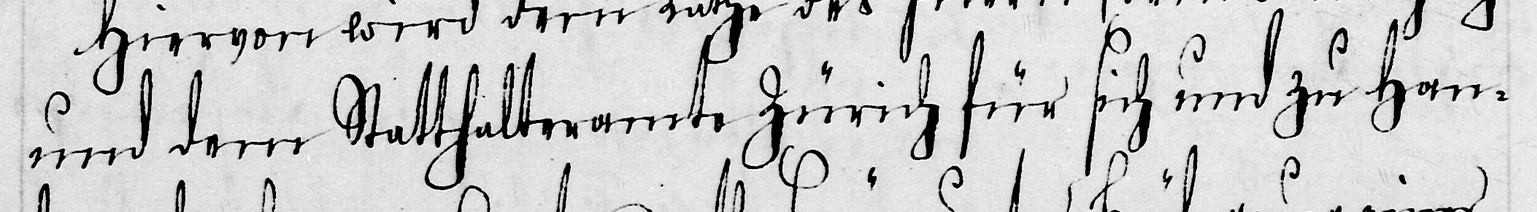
und dem Statthalteramte Zürich für sich und zu Han¬
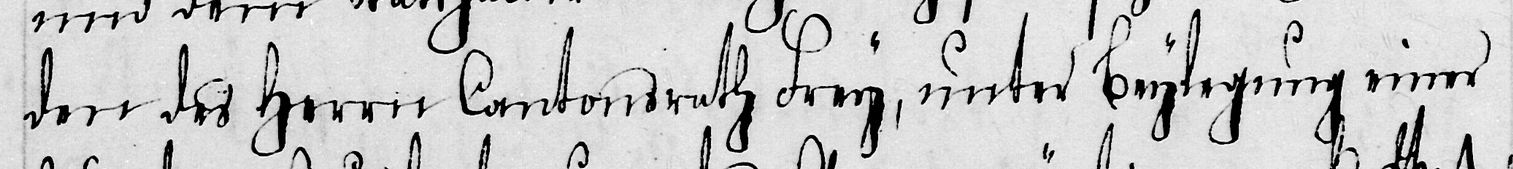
den des Herrn Cantonsrath Frey, unter Beylegung einer
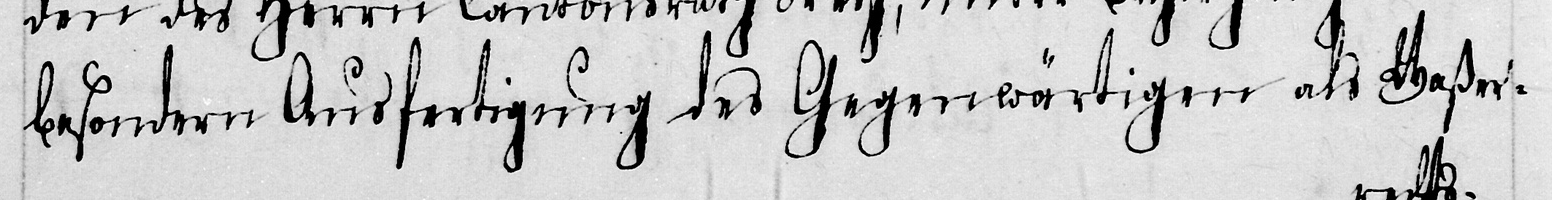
besondern Ausfertigung des Gegenwärtigen als Waßer-
